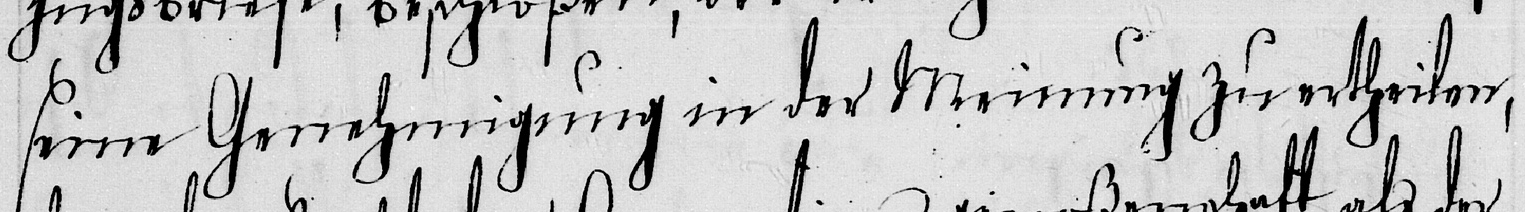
seine Genehmigung in der Meinung zu ertheilen,
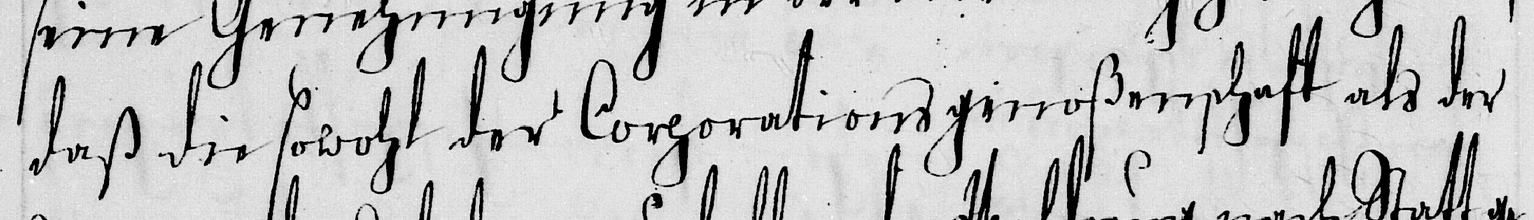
daß die sowohl der Corporationsgenoßenschaft als der
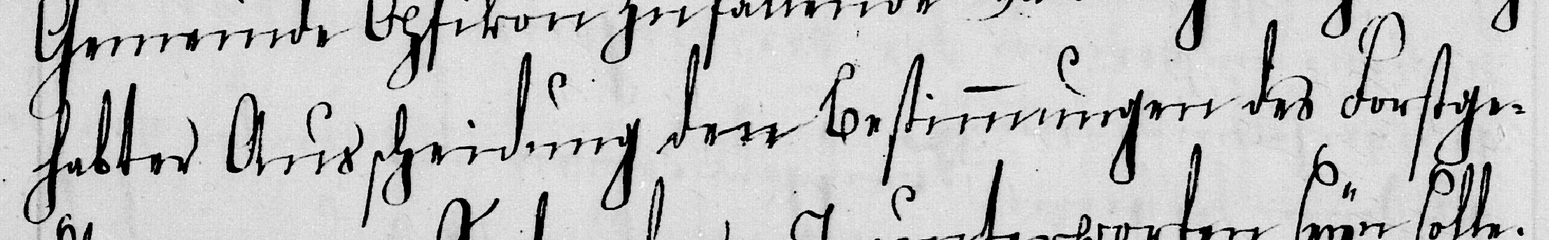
habter Ausscheidung den Bestimmungen des Forstge¬
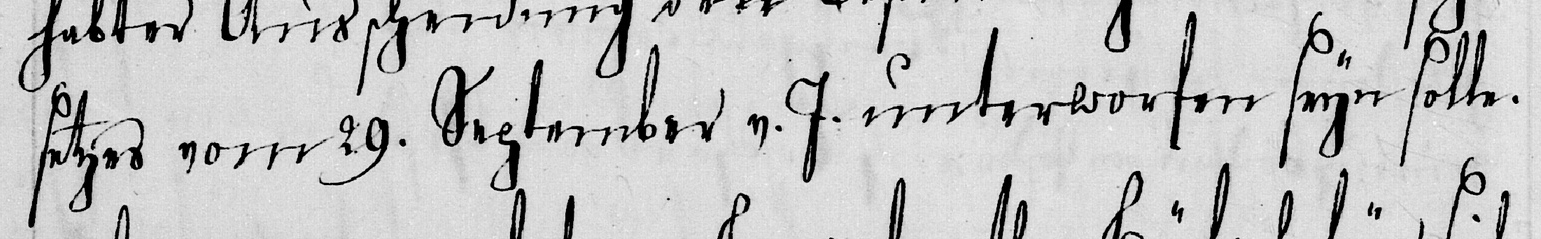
setzes vom 29. September v. J. unterworfen seyn solle.
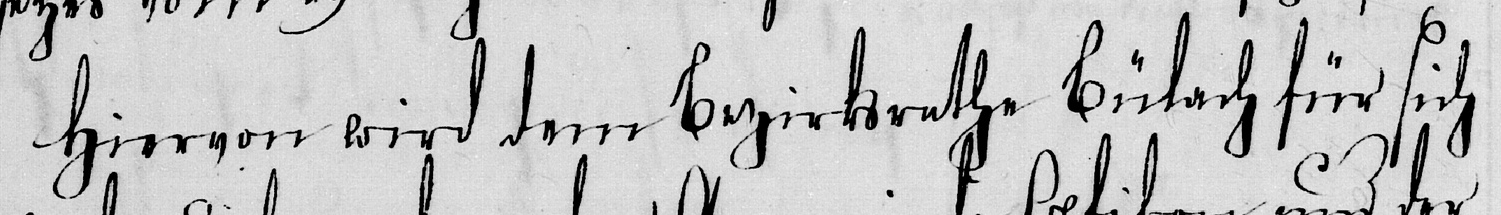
Hiervon wird dem Bezirksrathe Bülach für sich
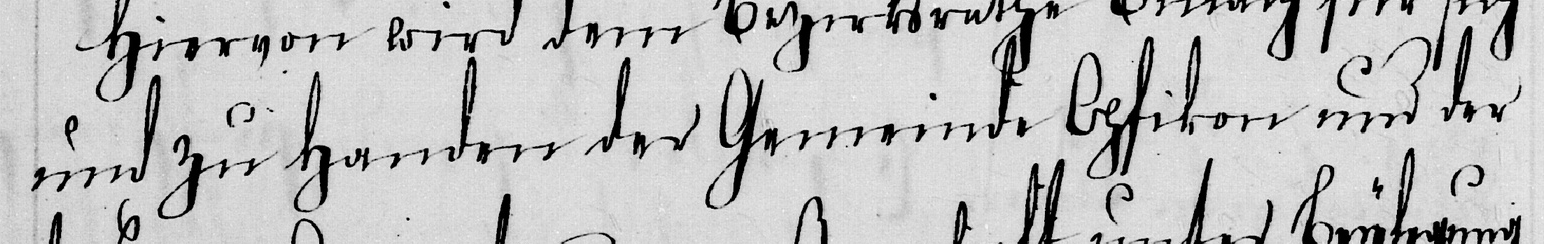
und zu Handen der Gemeinde Opfikon und der
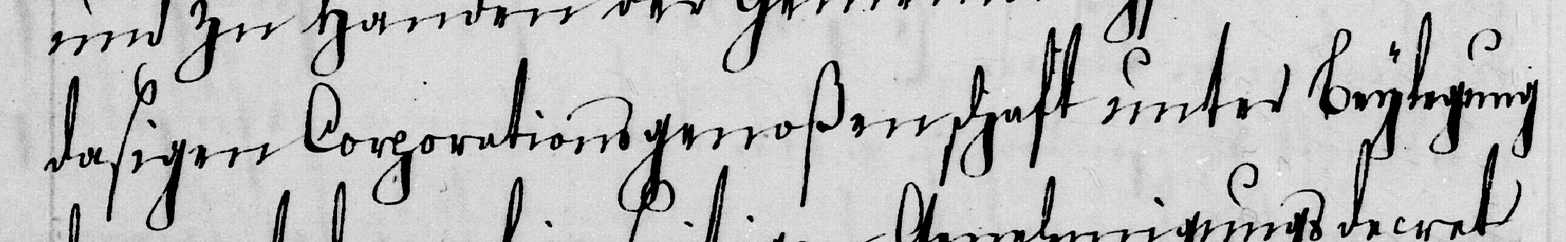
dasigen Corporationsgenoßenschaft unter Beylegung
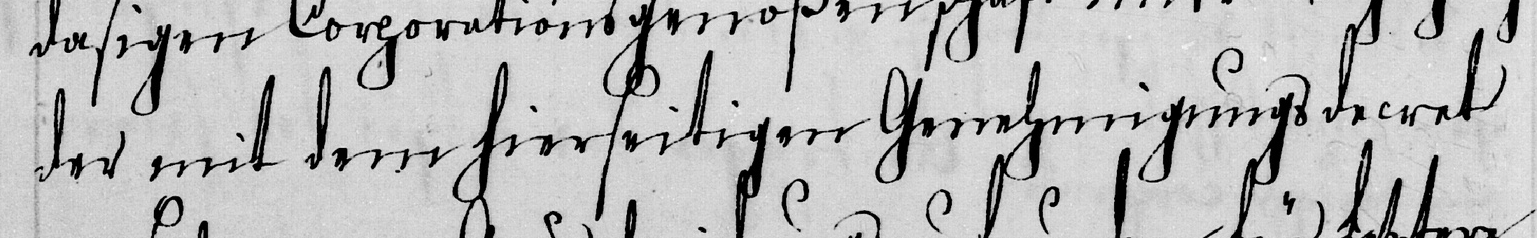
der mit dem hierseitigen Genehmigungsdecret
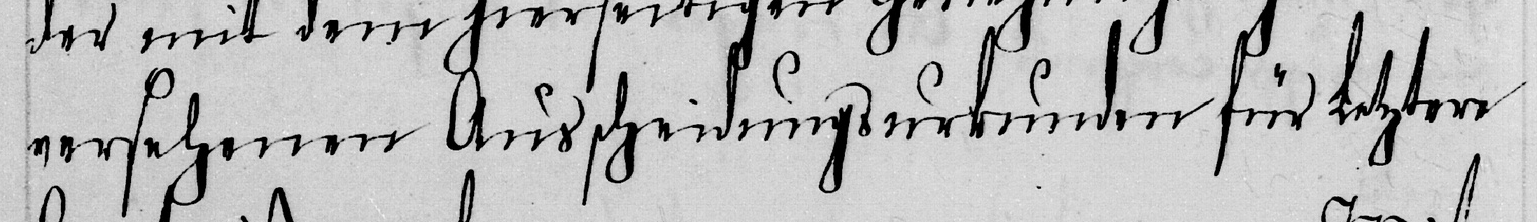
versehenen Ausscheidungsurkunden für Letztere
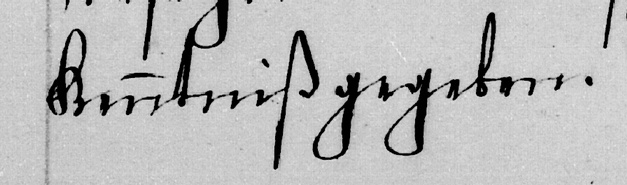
Kenntniß gegeben.
